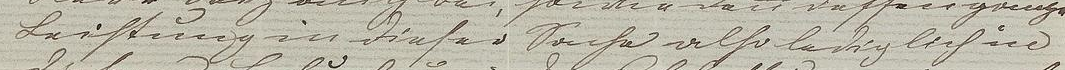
Leistung in dieser Sache also lediglich in
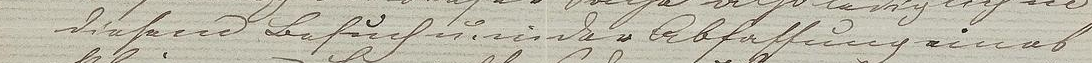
diesem Besuch u. in der Abfassung eines
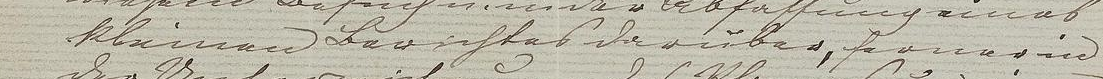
kleinen Berichtes darüber, ferner
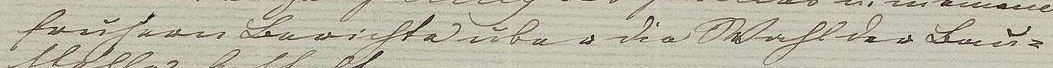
frühern Berichte über die Wahl der Bau-
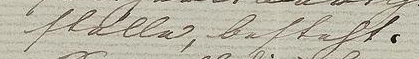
stelle, besteht.
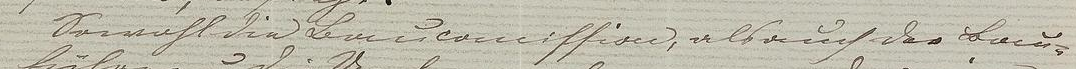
Sowohl die Baucomission, als auch der Bau-
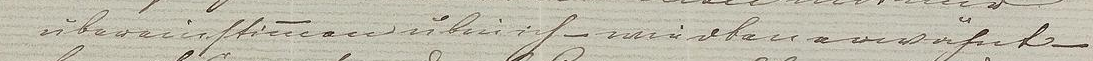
übereinstimmen u bin ich – wie oben erwähnt –
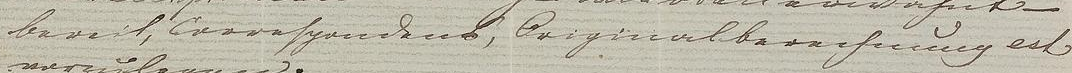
bereit, Correspondens, Originalberechnung ect
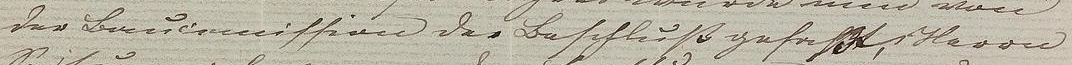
der Baucomission der Beschluß gefaßt, Herrn
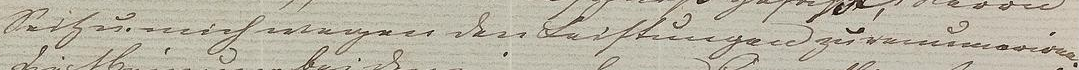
Seitz u. mich wegen den Leistungen zu remuneriren.
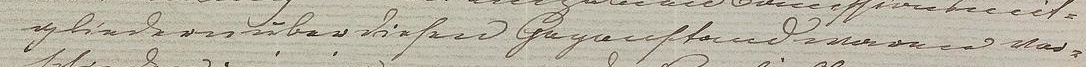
gliedern über diesen Gegenstand waren ver-
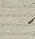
man
